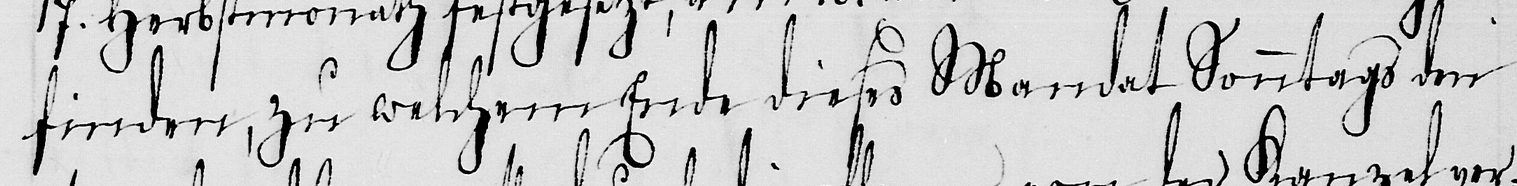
finden, zu welchem Ende dieses Mandat Sonntags den
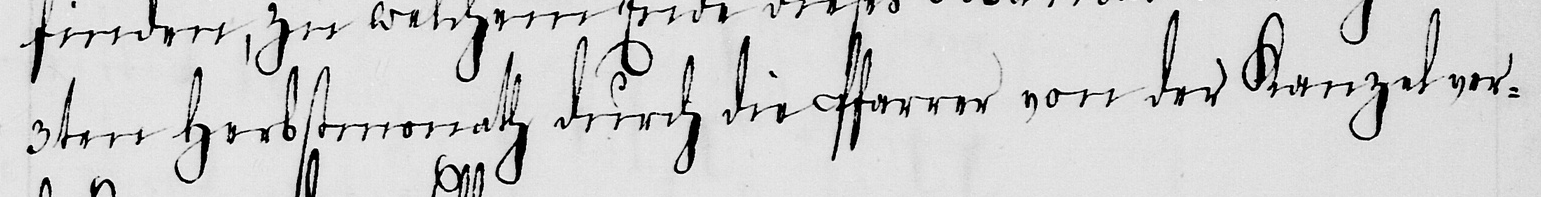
3ten Herbstmonath durch die Pfarrer von der Kanzel ver¬
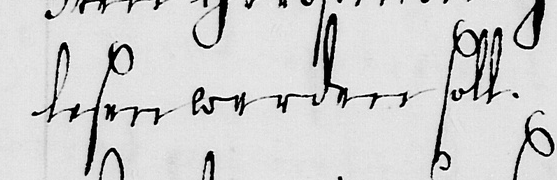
lesen werden soll.
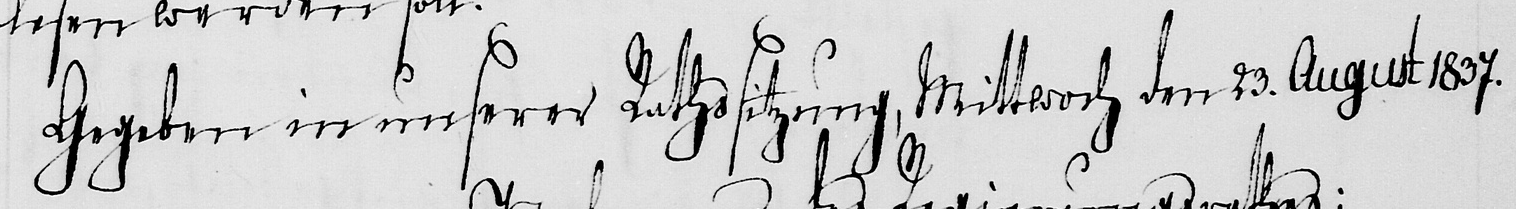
Gegeben in unserer Rathssitzung, Mittwoch den 23. August 1837.
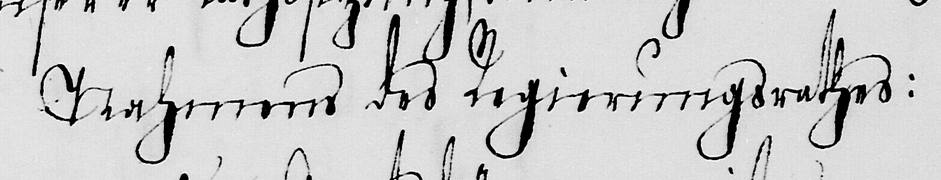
Nahmens des Regierungsrathes:
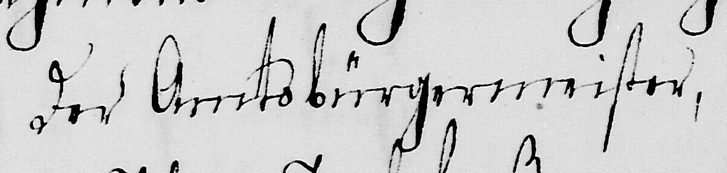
Der Amtsbürgermeister,
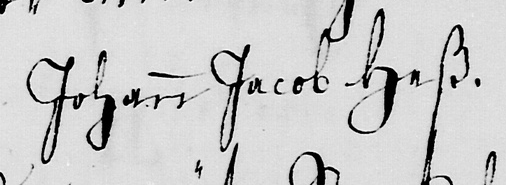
Johann Jacob Heß.
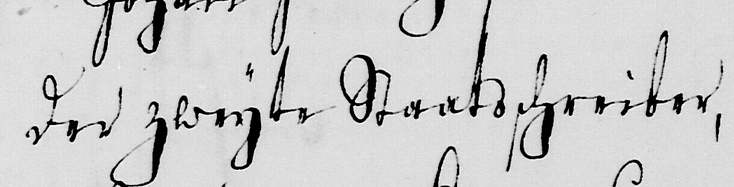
Der zweyte Staatsschreiber,
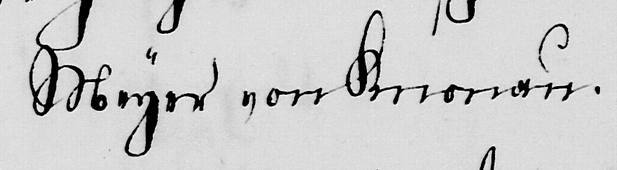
Meyer von Knonau.
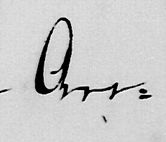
An-
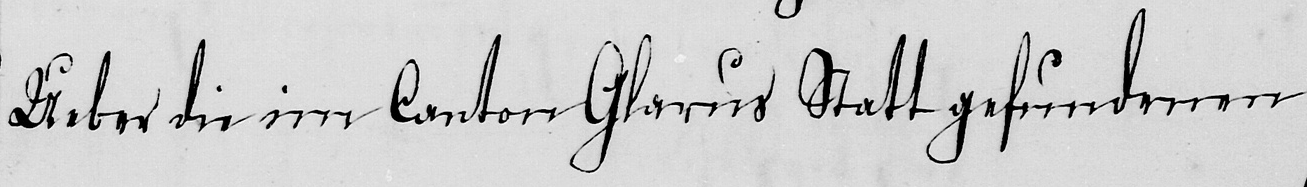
Ueber die im Canton Glarus Statt gefundenen
